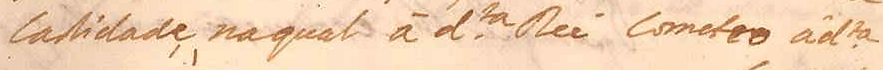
Castidade, na qual á d.ta Ree cometeo a d.ta
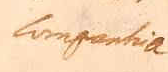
Companhia
